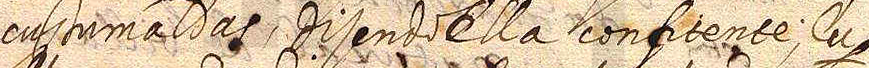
custumadas, disendo Ella confitente, Eu
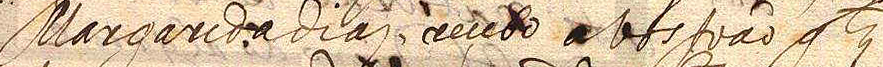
Margarida dias, reçebo a vos João gl̄z
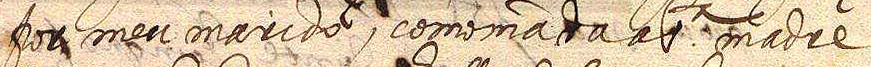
por meu marido, como māda a s.ta madre
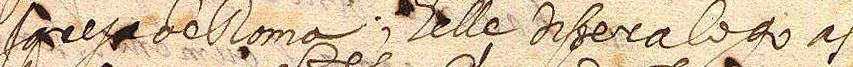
Jgreja de Roma; E elle dissera logo as
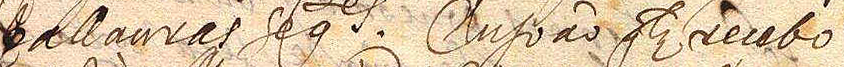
pallauras segtes. Eu joão gl̄z reçebo
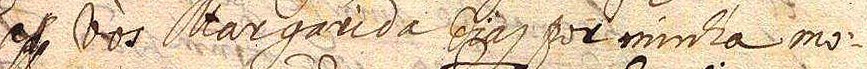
a _ vòs Margarida dias por minha mo
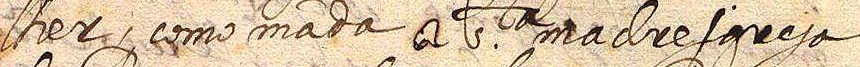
lher, como māda a s.ta madre Jgreja
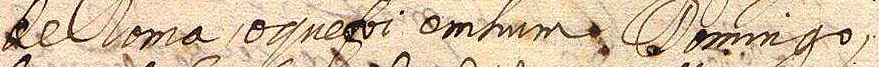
de Roma, o que foi em hum Domingo,
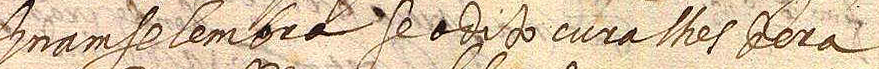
E nam se lembra se o dito cura lhes dera
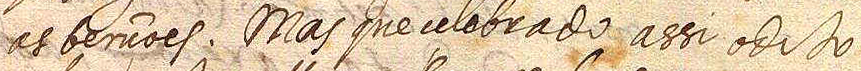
as benções. Mas que celebrado assi o dito
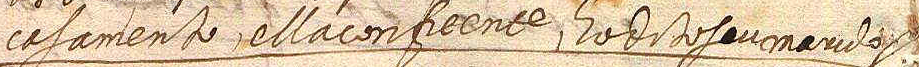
casamento, ella confitente, E o dito seu marido
